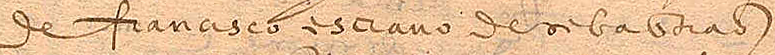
de francisco escrauo de sebastiaõ
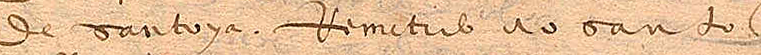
de santoya. Remetido ao santo
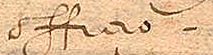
officio.
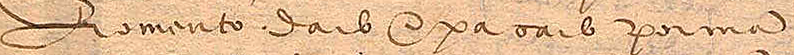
tromento dado e pasado por mā
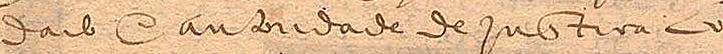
dado e autoridade de justiça cō
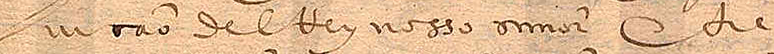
uisaõ del Rey nosso snnor̄ e tre
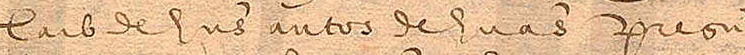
lado de hus̄ autos de huas̄ pregū
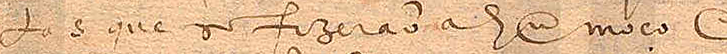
tas que se fizeraõ a hū moço e
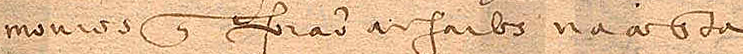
mouros q̄ foraõ achados na costa
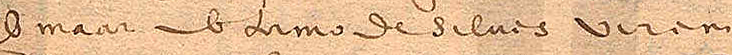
do maar do termo de silues virem
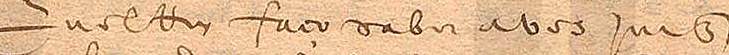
Eu el Rey faço saber a vos juiz
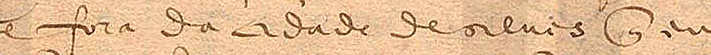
de fora da cidade de silues q̄ eu
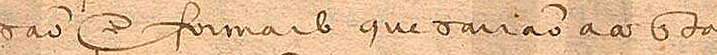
saõ ēformado que sairaõ a costa
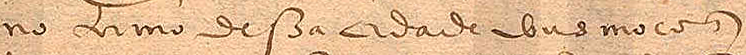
no termo dessa cidade dous moços
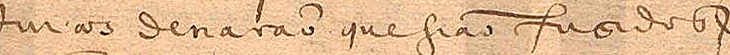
turcos de naçaõ que hiaõ fugidos
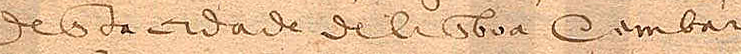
desta cidade de lisboa e embar
